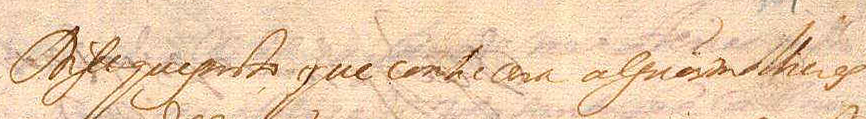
Disse que posto que conhecera alguās molheres
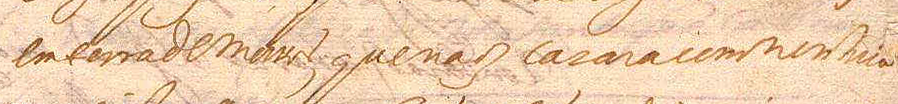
em terra de mouros, que naõ cazara com nenhua
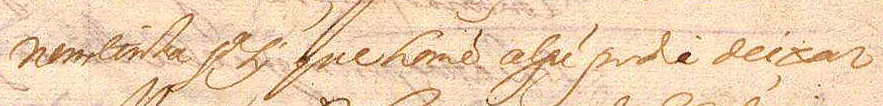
nem tinha pa sy que homē algū pode deixar
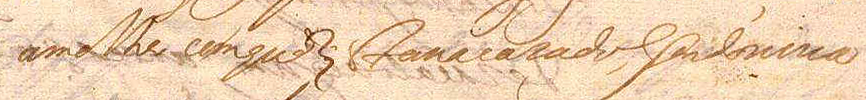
a molher com quē estaua cazado, E sendo uiua
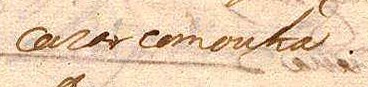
cazar com outra.
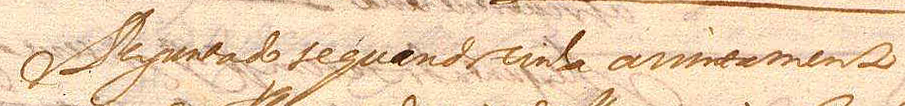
item Perguntado se quando tinha aiuntamento
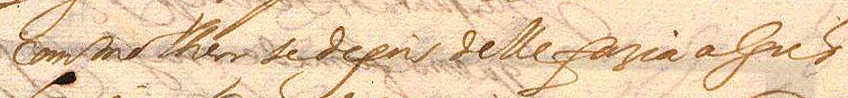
com molher se depois delle fazia algus̄
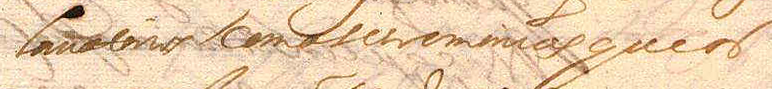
lauatorios com as ceremonias que os
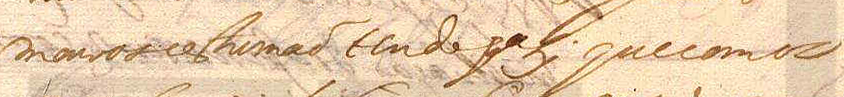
mouros costumaõ tendo pa sy que com os
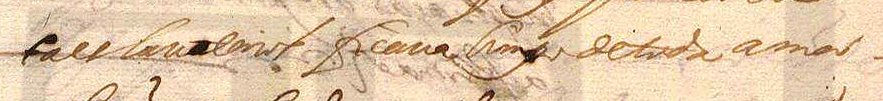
taes lauatoros ficaua limpo de toda a ma
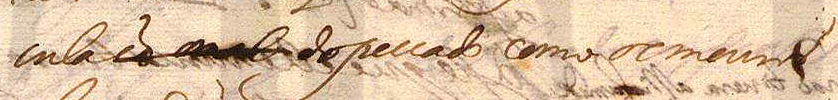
culaçā o mal do peccado como os mouros
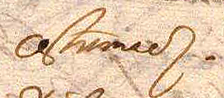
costumaõ?
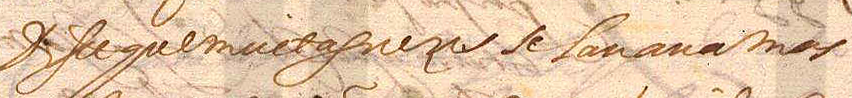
Disse que muitas uezes se lauaua mas
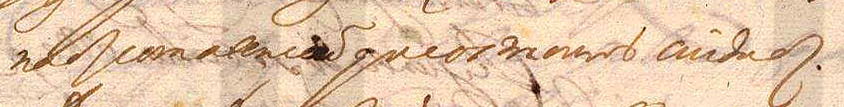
naõ com a tençaõ que os mouros cuidaõ.
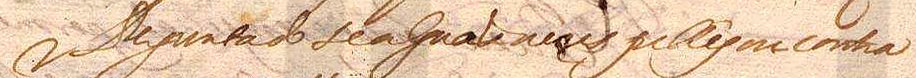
item Perguntado se alguās uezes pellejou contra
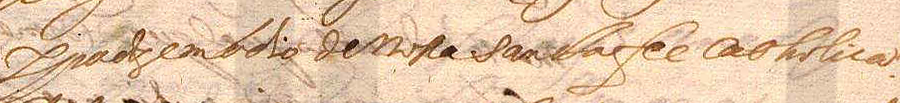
xpaõs em ódio de nossa sancta fee catholica?
